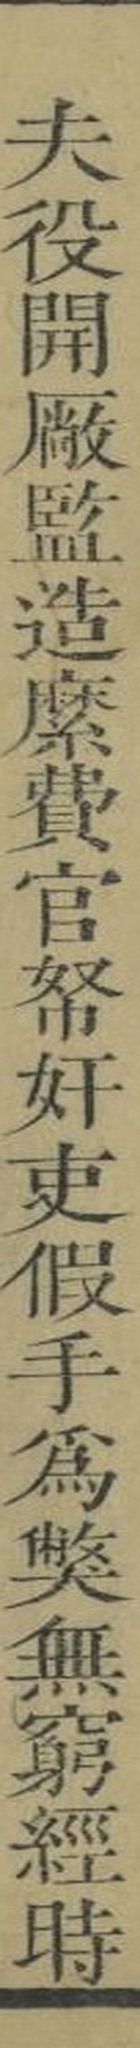夫役開厰監造縻費官帑奸吏假手爲獘無窮經時
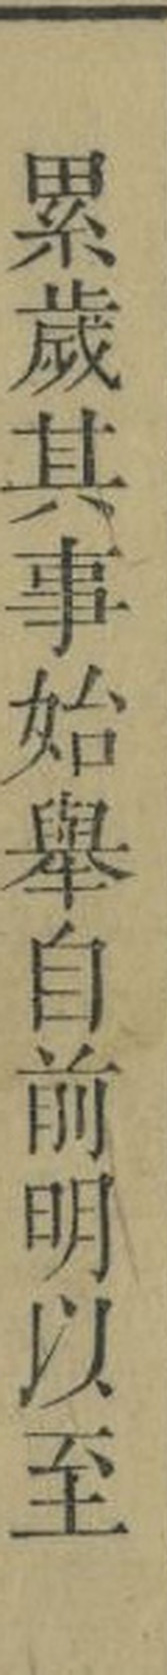累歲其事始舉自前明以至
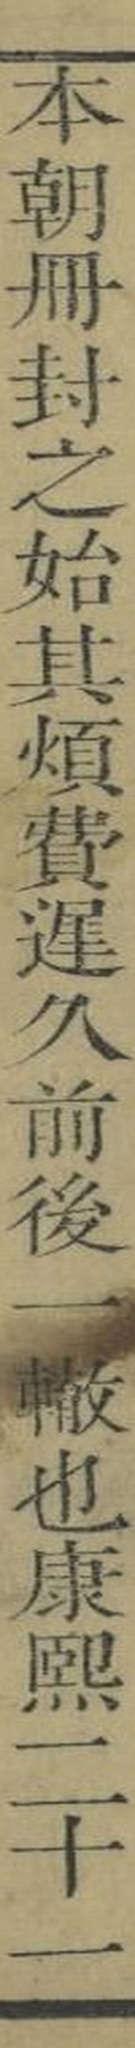本朝冊封之始其煩費遲久前後一轍也康熙二十一
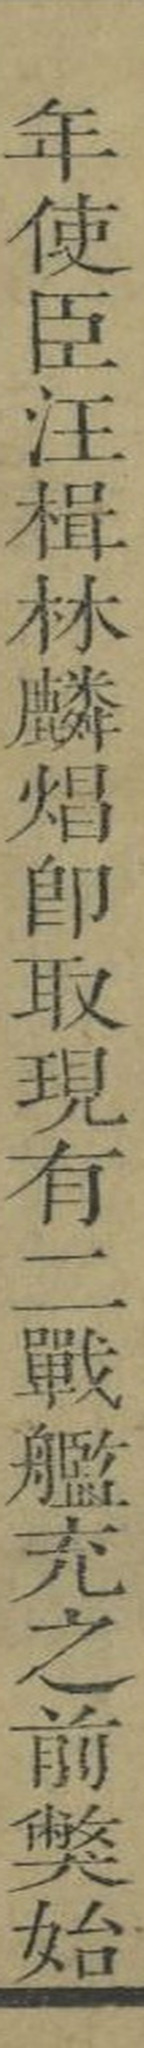年使臣汪楫林麟焻卽取現有二戰艦充之前獘始
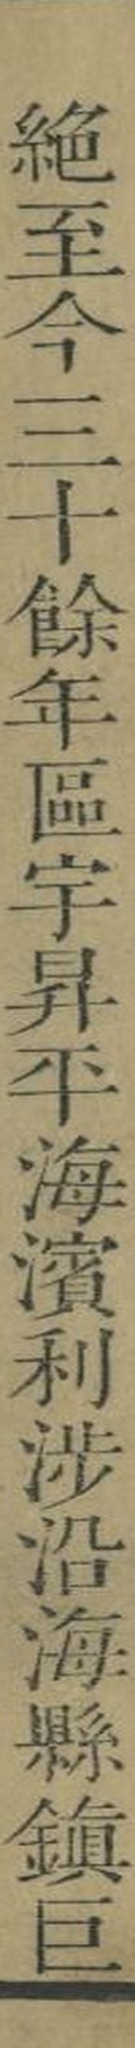絶至今三十餘年區宇昇平海濱利涉沿海縣鎭巨

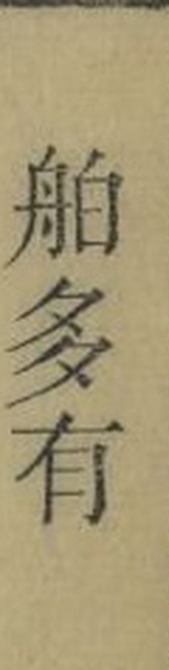舶多有
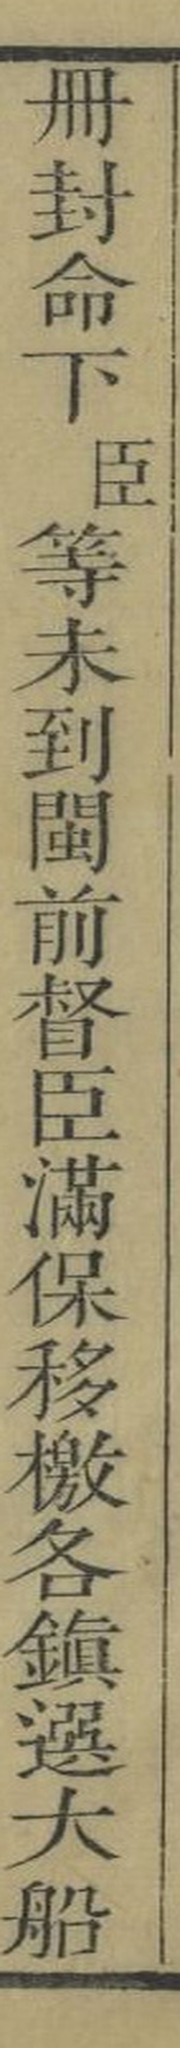冊封命下臣等未到閩前督臣滿保移檄各鎭選大船
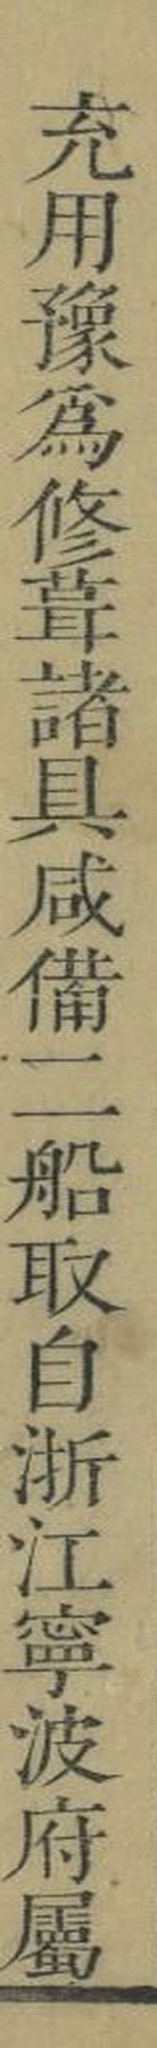充用豫爲修葺諸具咸備二船取自浙江寧波府屬
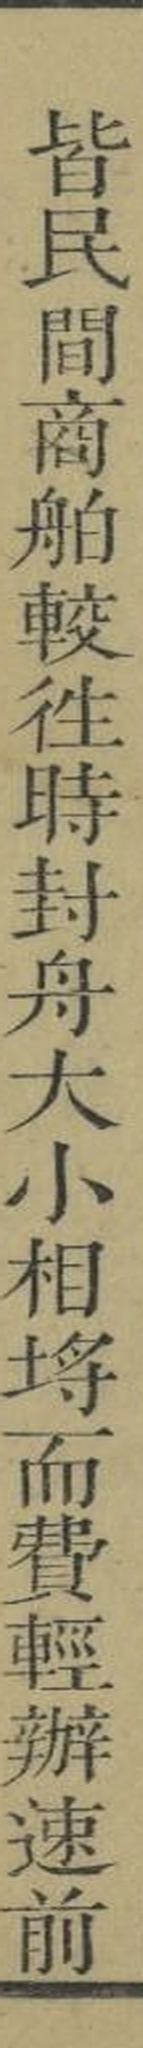皆民間商舶較徃時封舟大小相埓而費輕辦速前
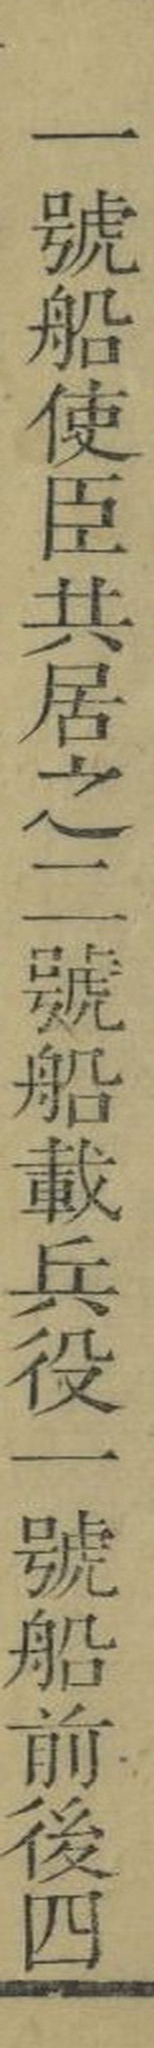一號船使臣共居之二號船載兵役一號船前後四
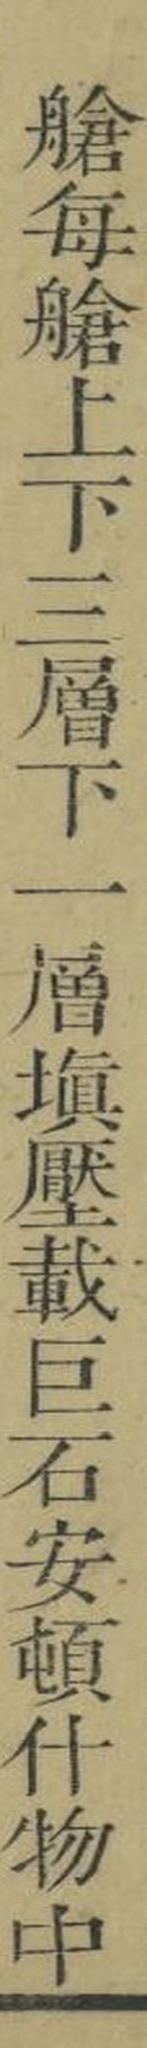艙每艙上下三層下一層塡壓載巨石安頓什物中
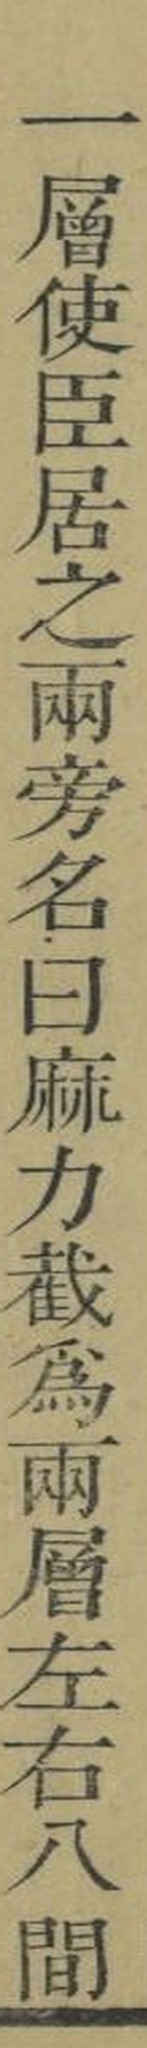一層使臣居之兩旁名曰麻力截爲兩層左右八間
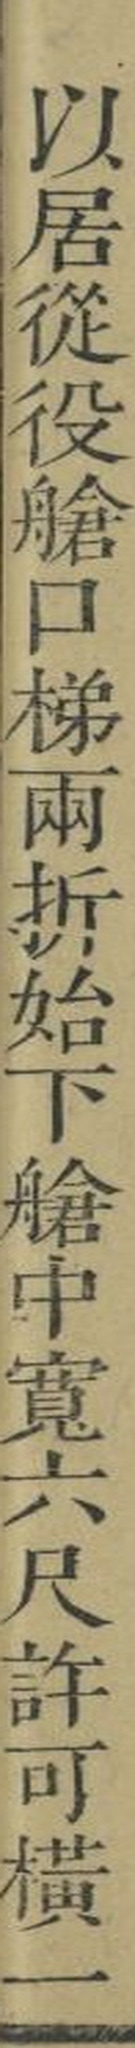以居從役艙口梯兩折始下艙中寬六尺許可橫一
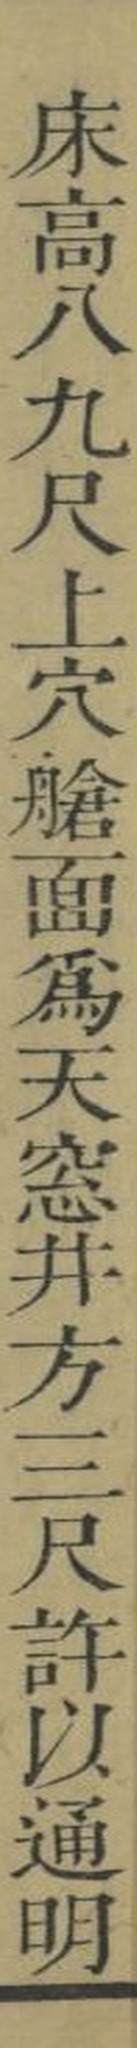床高八九尺上穴艙面爲天窓井方三尺許以通明
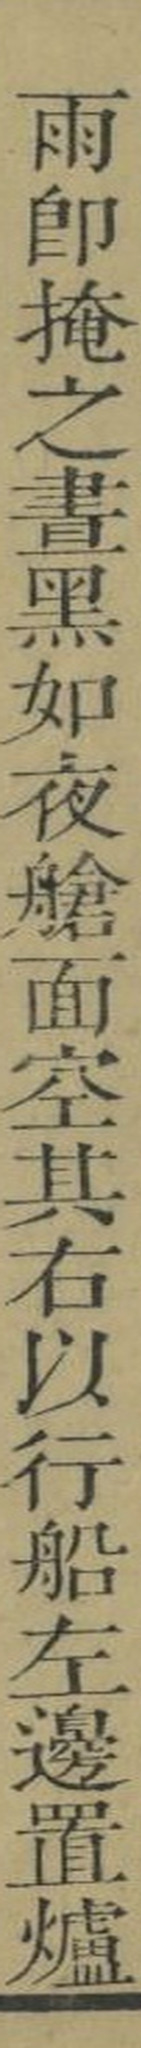雨卽掩之晝黑如夜艙面空其右以行船左邊置爐
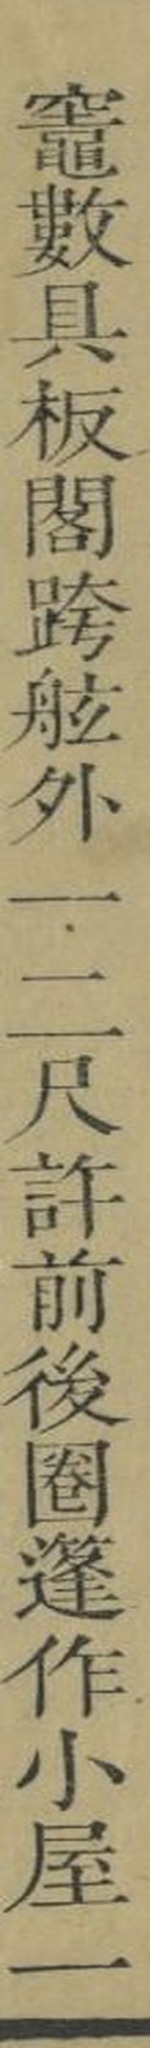竈數具板閣跨舷外一二尺許前後圈篷作小屋一
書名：中山伝信録 巻一
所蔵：University of the Ryukyus Library
